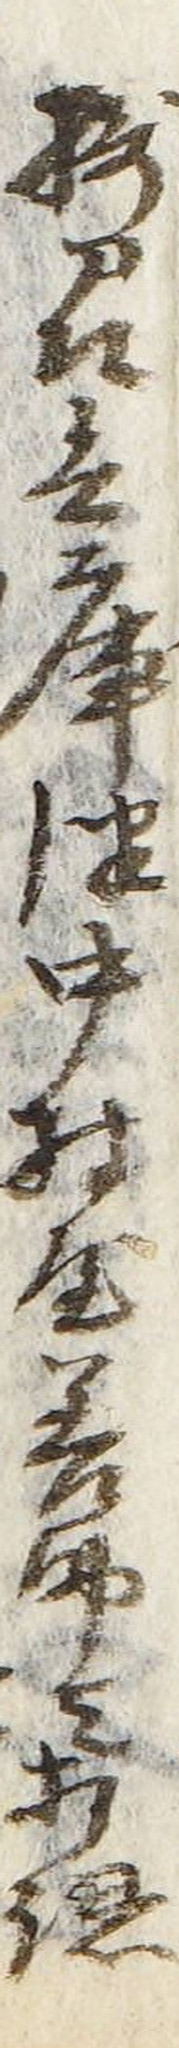摂州兵庫津中村屋善助と相認
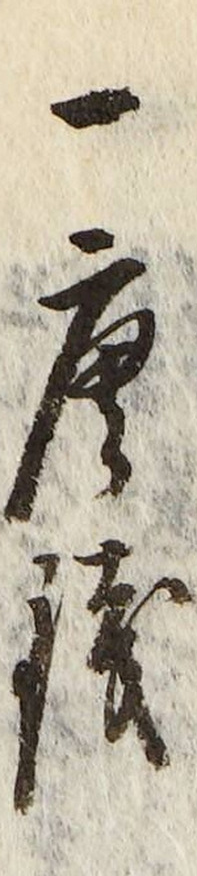一唐銭
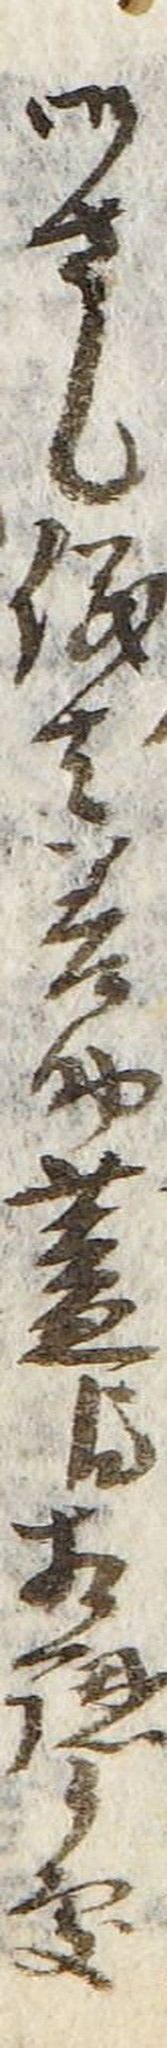御座候儀者善助蓋江相認候處
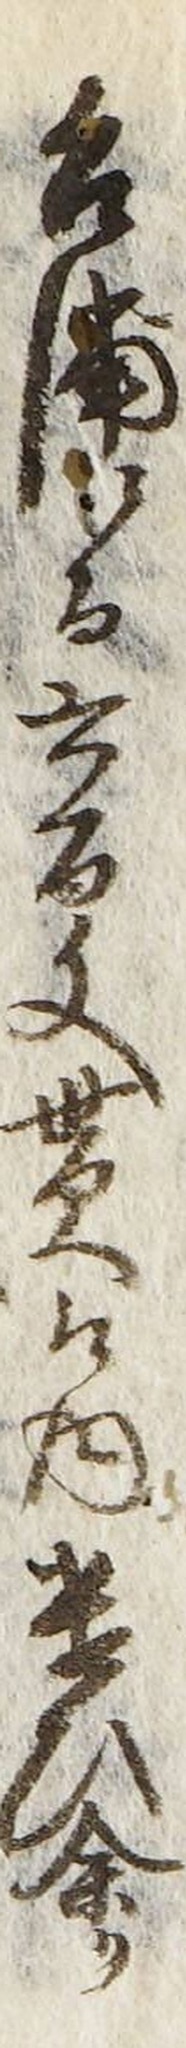乍浦ニ而六百文貰候内遣ひ余り
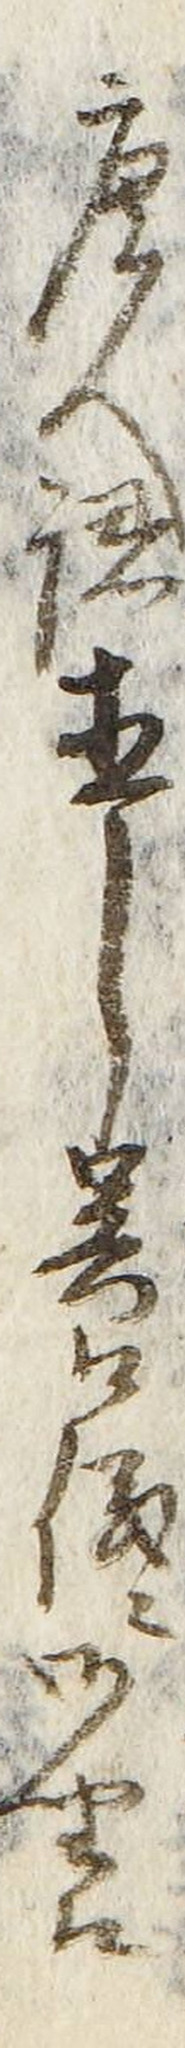唐人認直し呉候儀ニ御座候
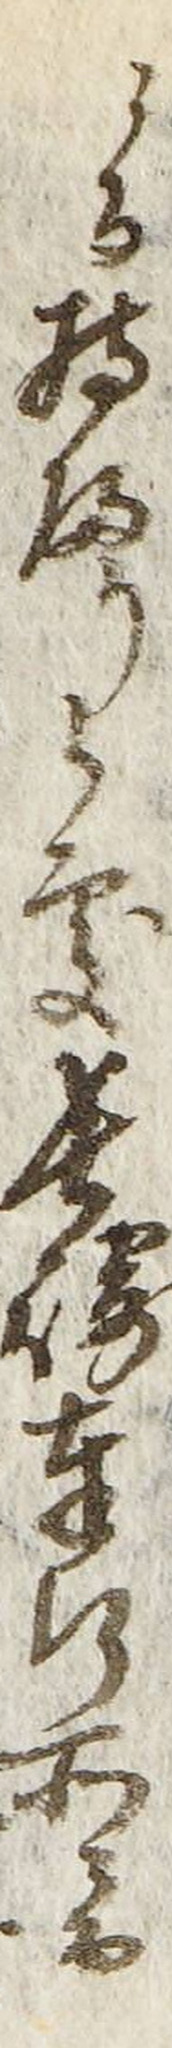ニ而持帰り候處長崎奉行所ニ而
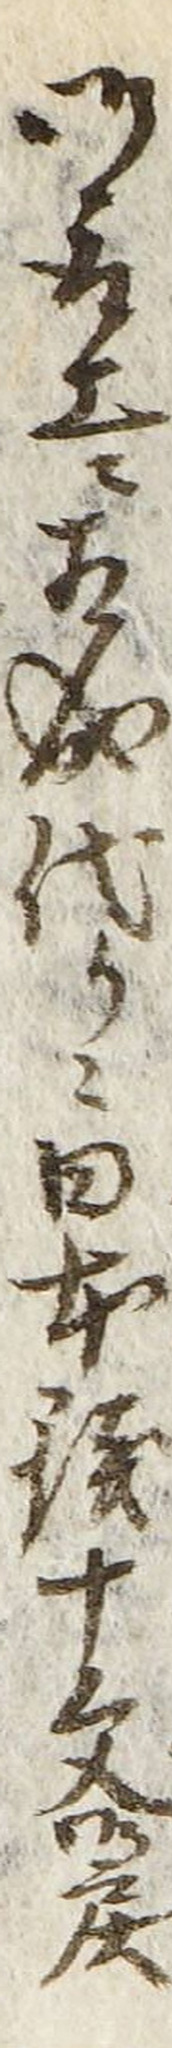御取上ニ相成代りニ日本銭十文御戻
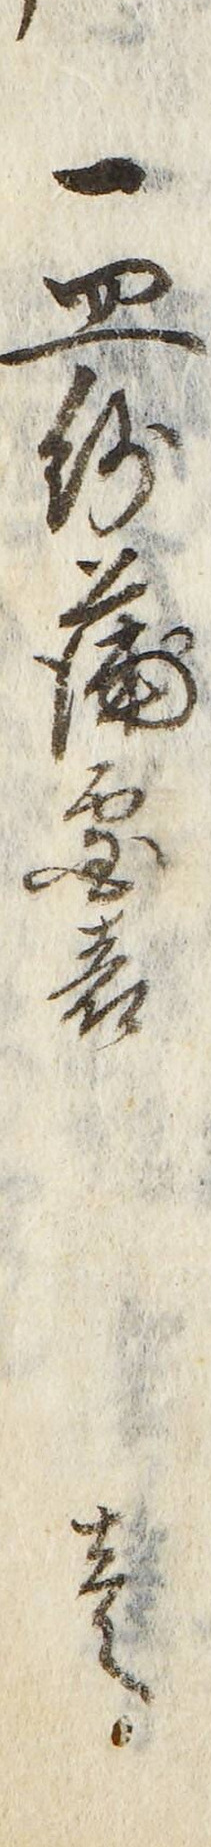一皿紗蒲團表壱
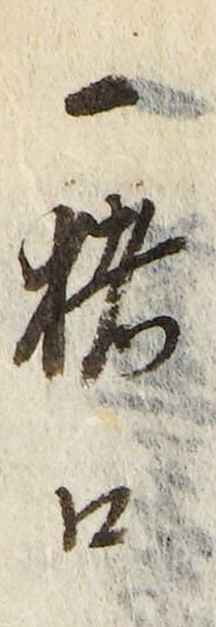一猪口

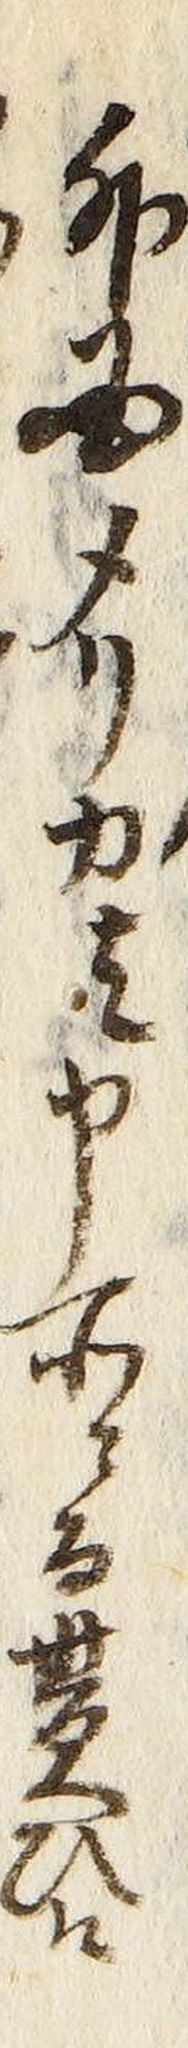外国メリカと申所ニ而貰ひ候
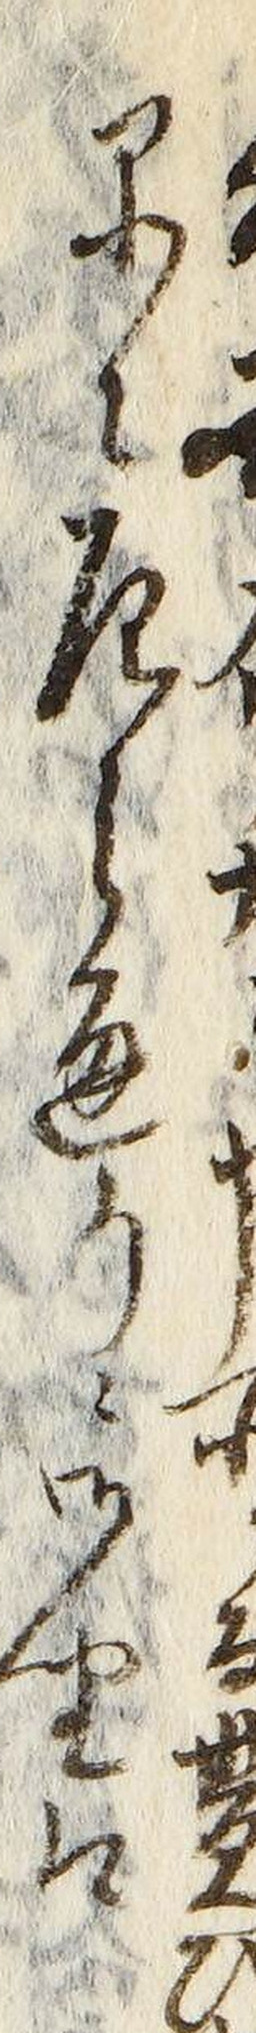品々左之通りニ御座候
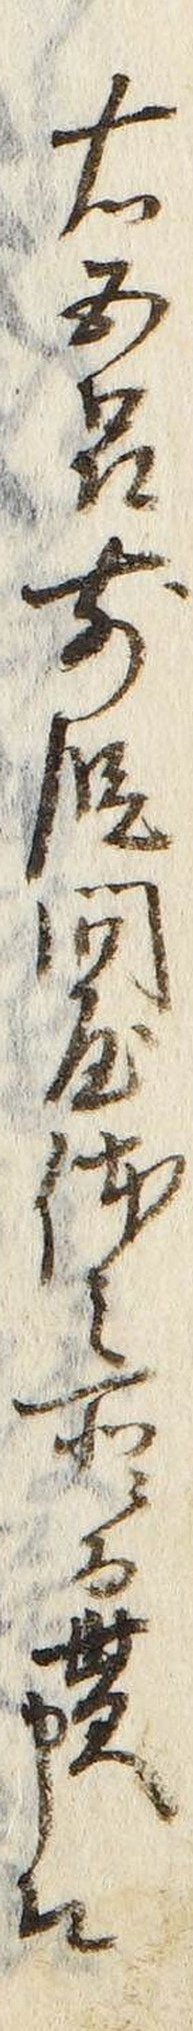右五品前段問屋体之所ニ而貰申候
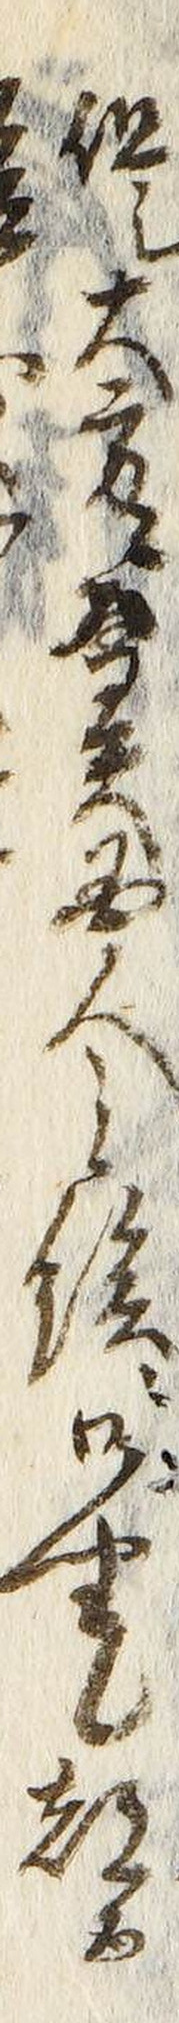但シ大方ニハ異国人之絵ニ御座候都而
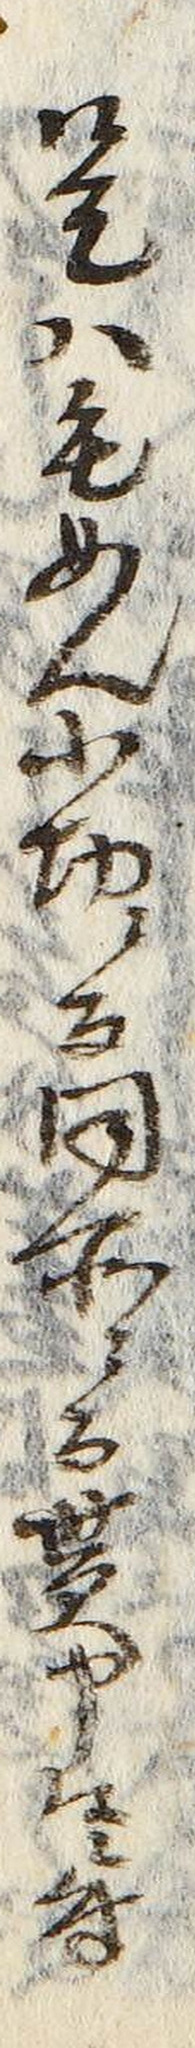是ハ毛めん小切ニ而同所ニ而貰申候ニ付
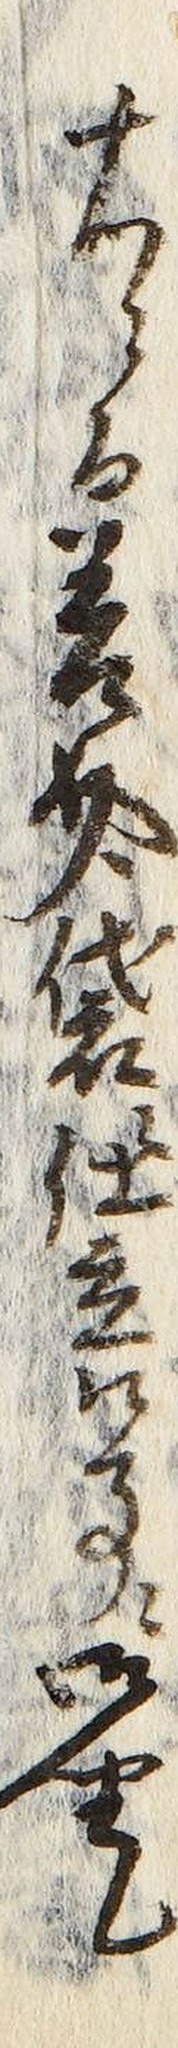右ニ而善助袋ニ仕立候事ニ御座候
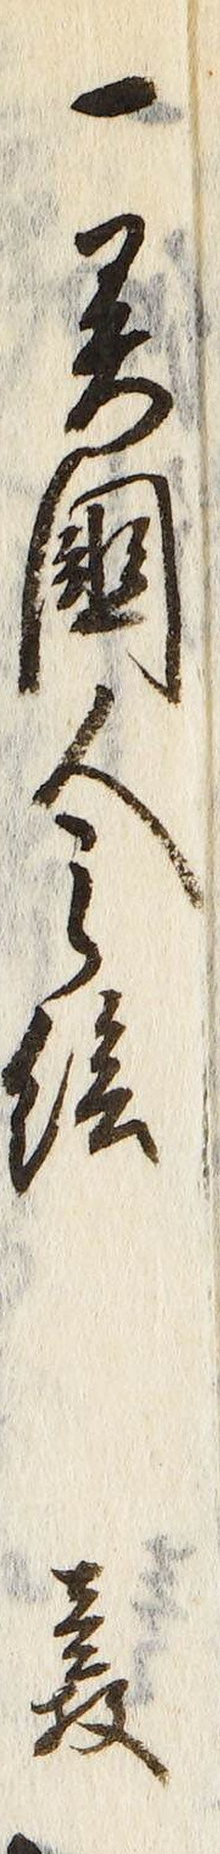一異國人之絵壱枚
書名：漂流人善助聞書
